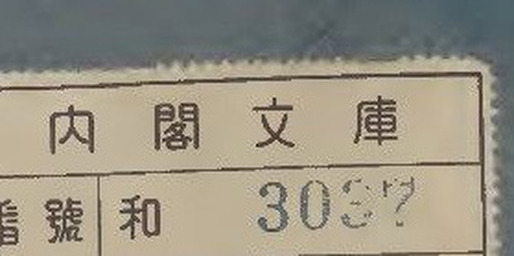内閣文庫
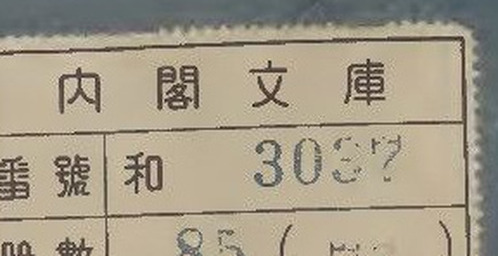内閣文庫
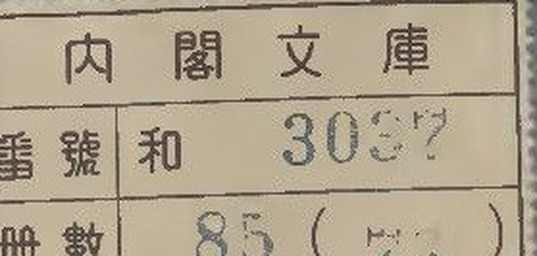番號和
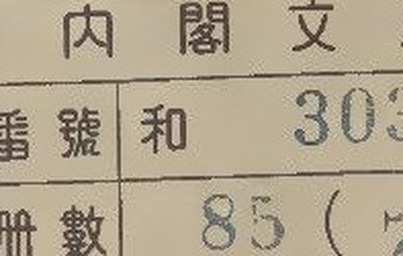番號和
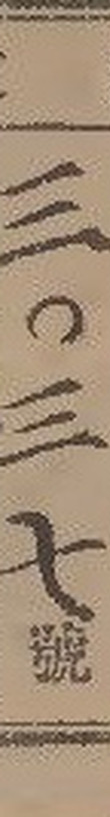三〇三七號

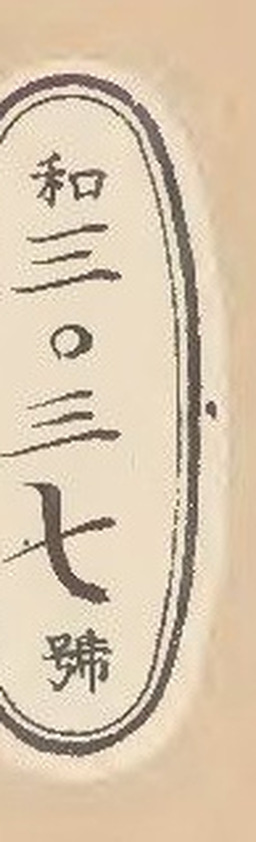和三〇三七號
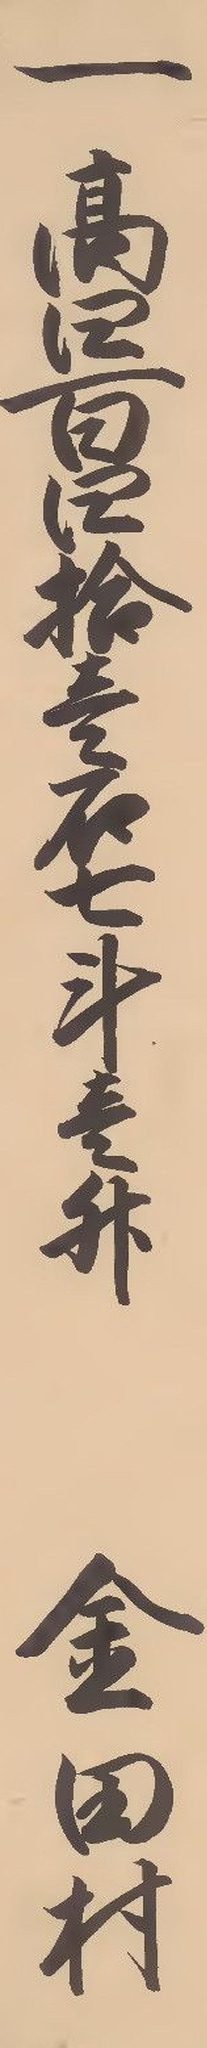一高四百四拾壱石七斗壱升金田村
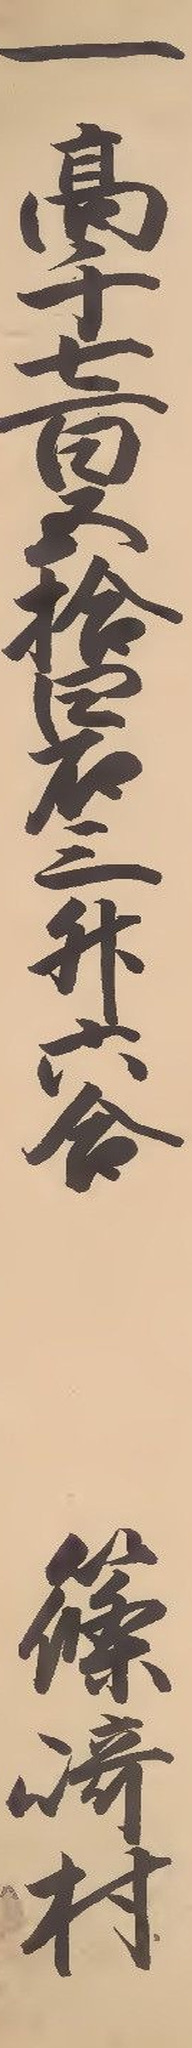一高千七百五拾四石三升六合篠崎村

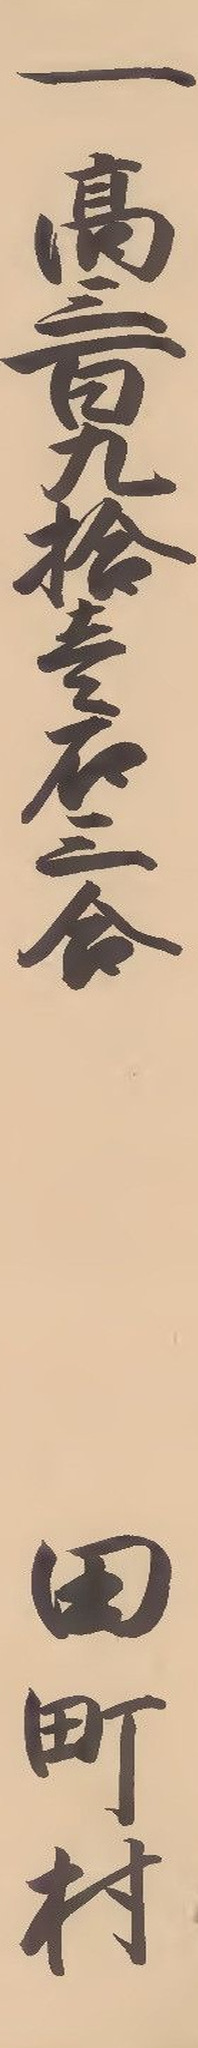一高三百九拾壱石三合田町村
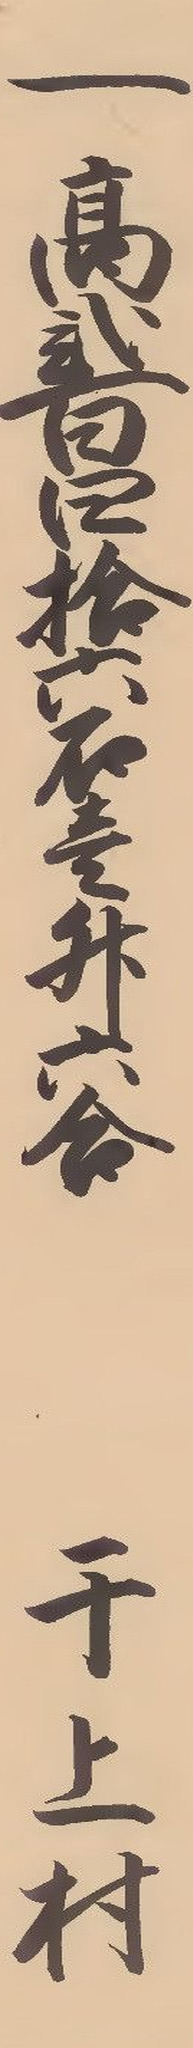一高弐百四拾六石壱升六合干上村
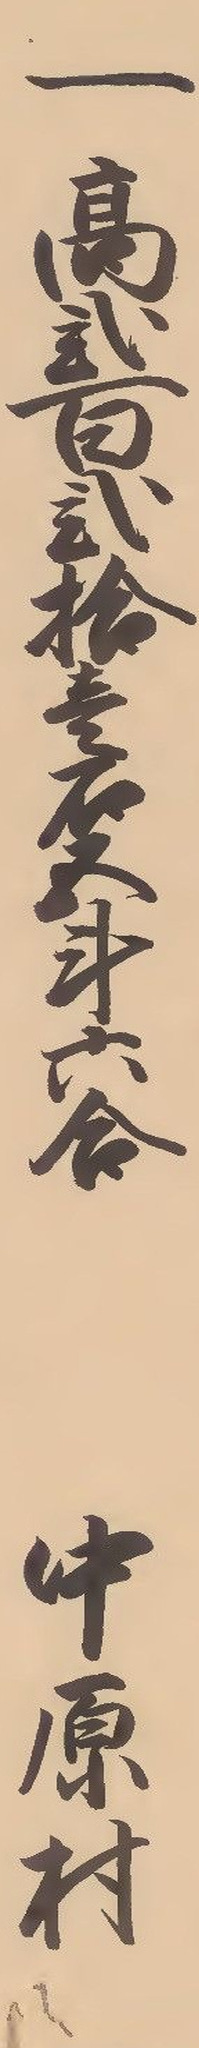一高弐百弐拾壱五斗六合中原村
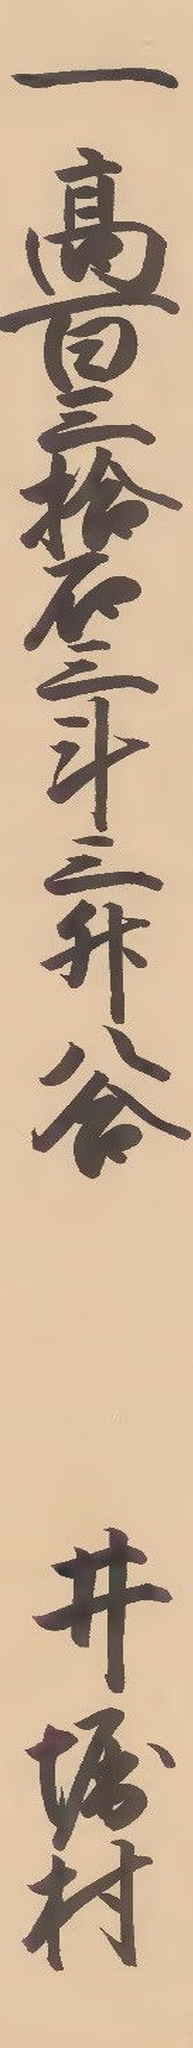一高百三拾石三斗三升八合井堀村
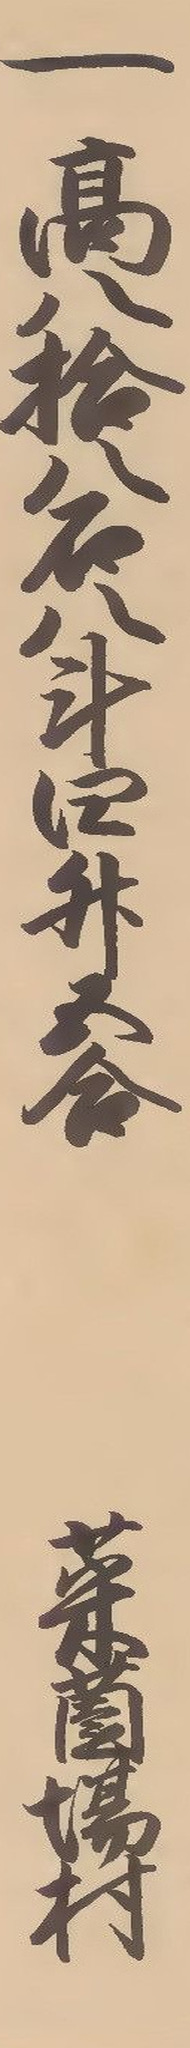一高八拾八石八斗四升五合菜薗場村
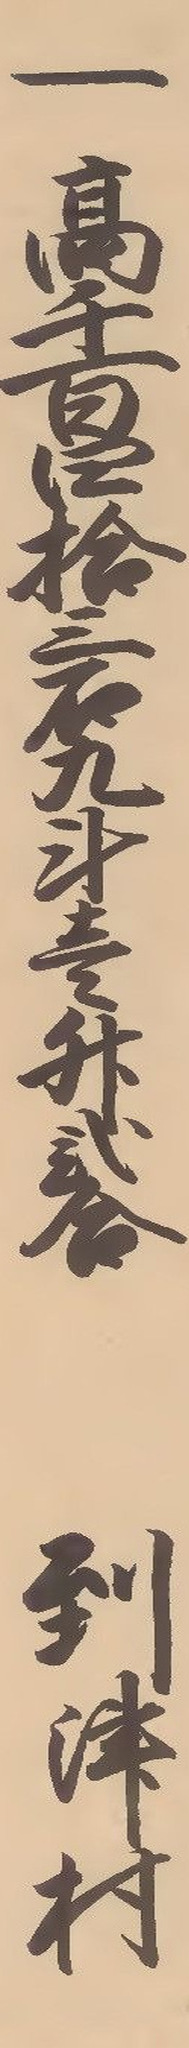一高千百四拾三石九斗壱升弐合到津村
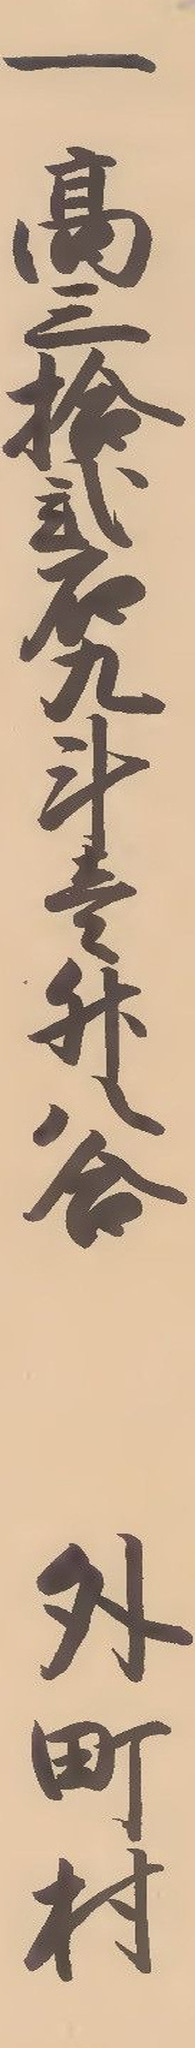一高三拾弐石九斗壱升八合外町村
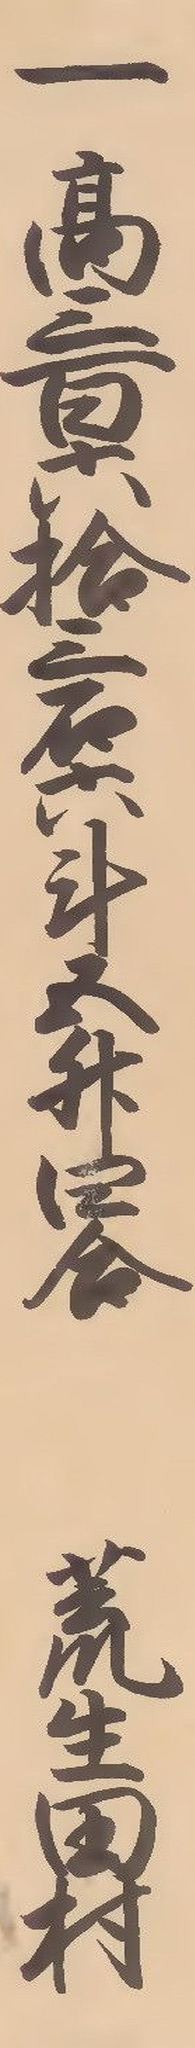一高三百六拾三石六斗五升四合荒生田村
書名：豊前国郷帳
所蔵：国立公文書館 National Archives of Japan
